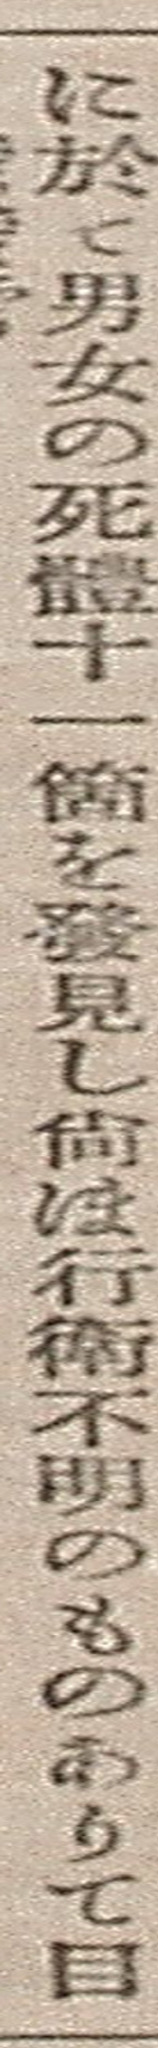に於て男女の死体十一箇を発見し尚ほ行衛不明のものありて目
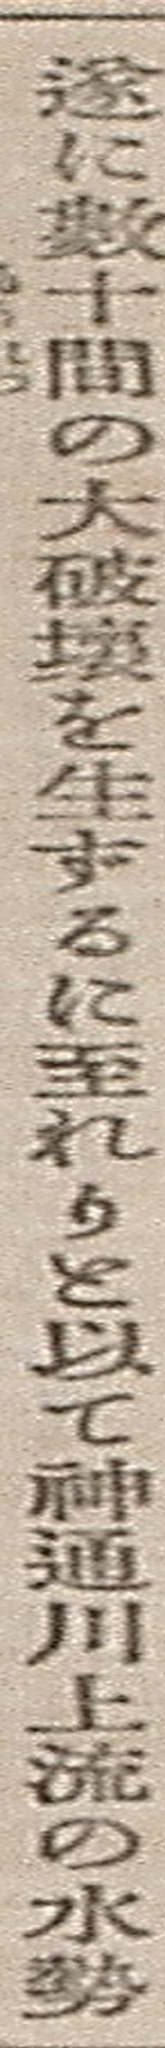遂に数十間の大破壊を生ずるに至れりと以て神通川上流の水勢
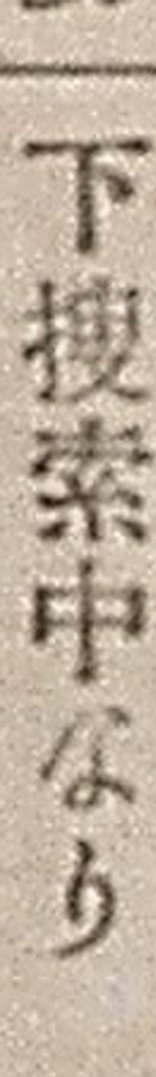捜索中なり
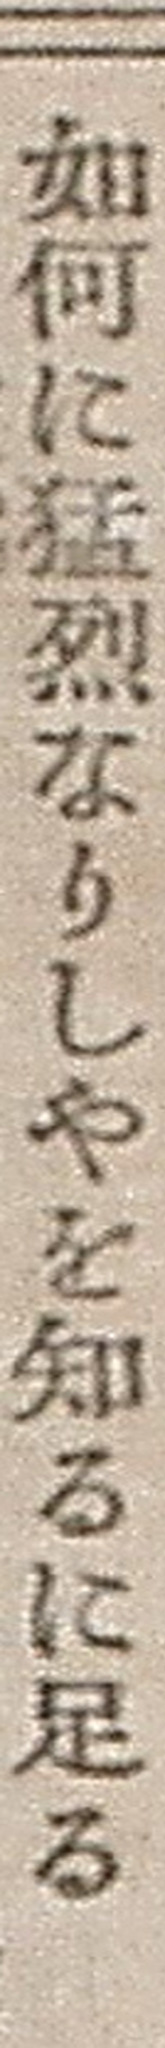如何に猛烈なりしやを知るに足る
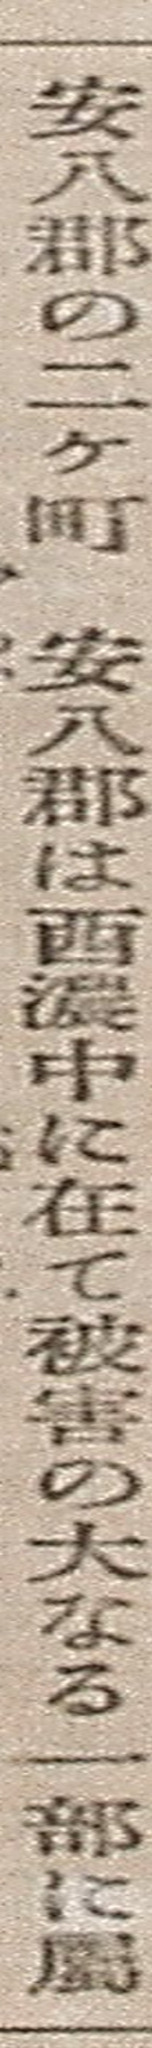安八郡の二ヶ村安八郡は西濃中に在て被害の大なる一部に属
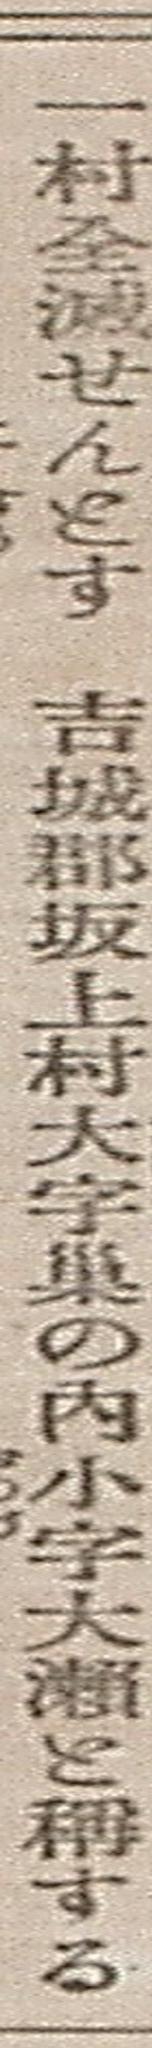一村全滅せんとす吉城郡坂上村大字巣の内小字大瀬と称する
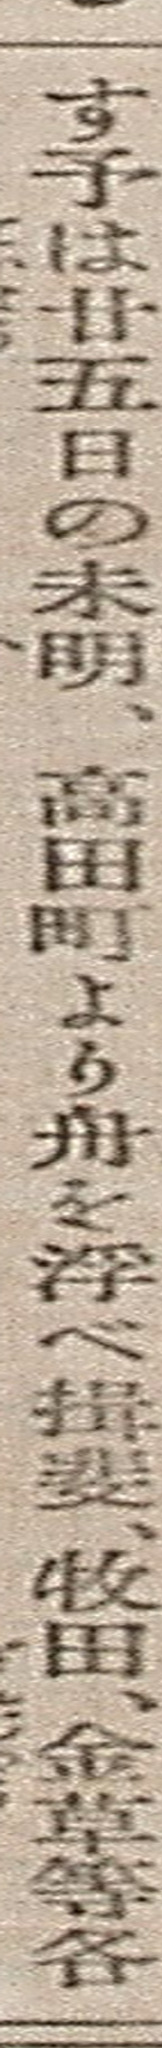す予は廿五日の未明、高田町より舟を浮べ揖斐、牧田、金草等各
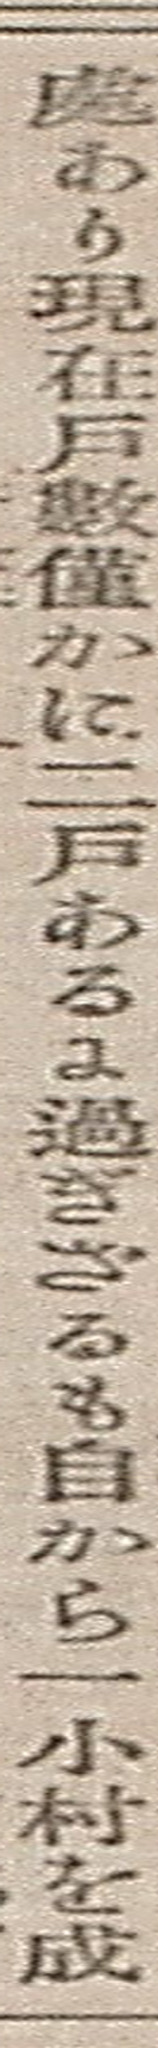処あり現在戸数僅かに二戸あるに過ぎざるも自から一小村を成
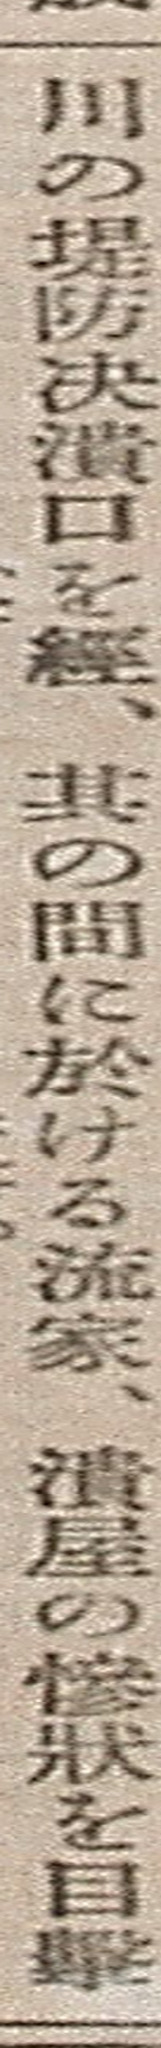川の堤防决潰口を経、其の間に於ける流家、潰屋の惨状を目撃
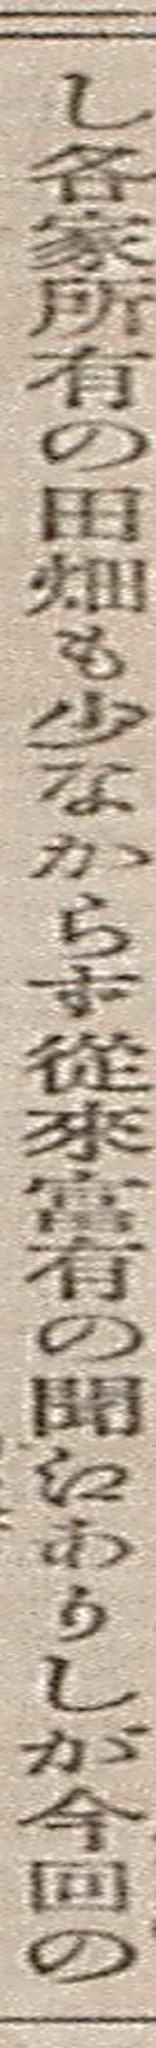し各家所有の田畑も少なからず従来富裕の聞江ありしが今回の
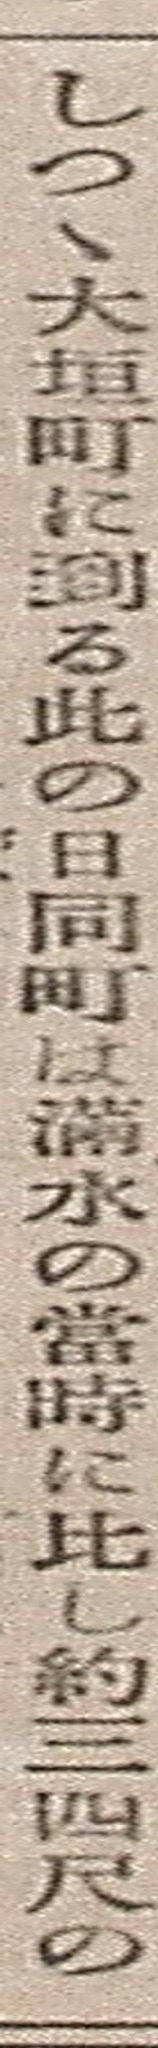しつゝ大垣町に到る此の日同町は満水の当時に比し約三四尺の
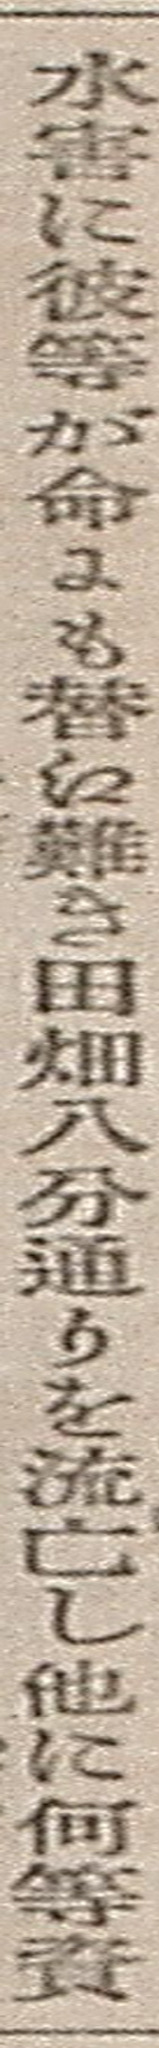水害に彼等が命にも替江難き田畑八分通りを流亡し他に何等資
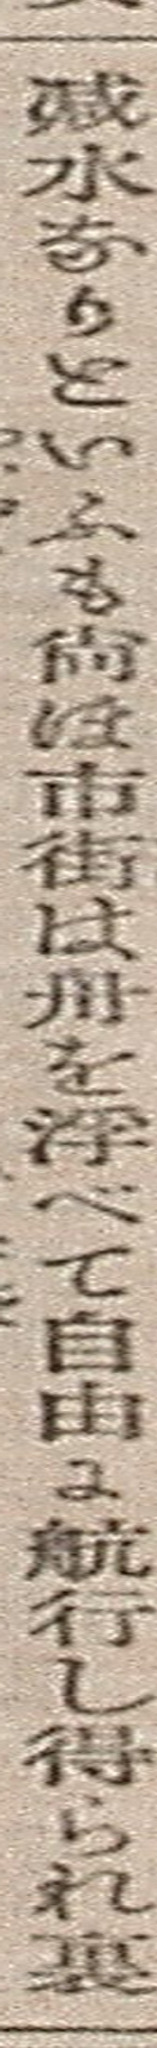減水なりといふも尚ほ市街は舟を浮べて自由に航行し得られ裏
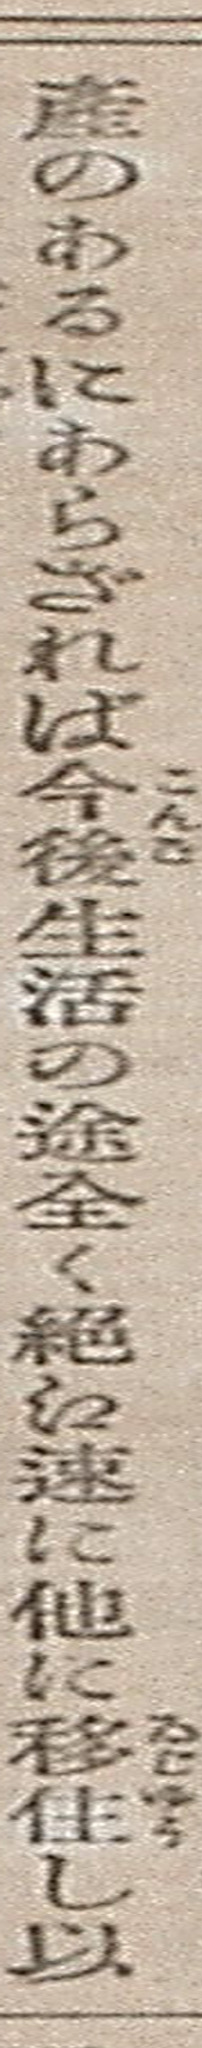産のあるにあらざれば今後生活の途全く絶江速に他に移住し以
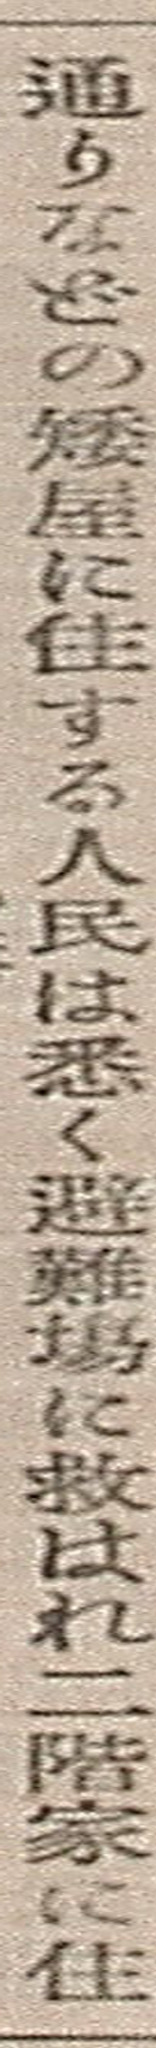通りなどの矮屋に住する人民は悉く避難場に救はれ二階家に住
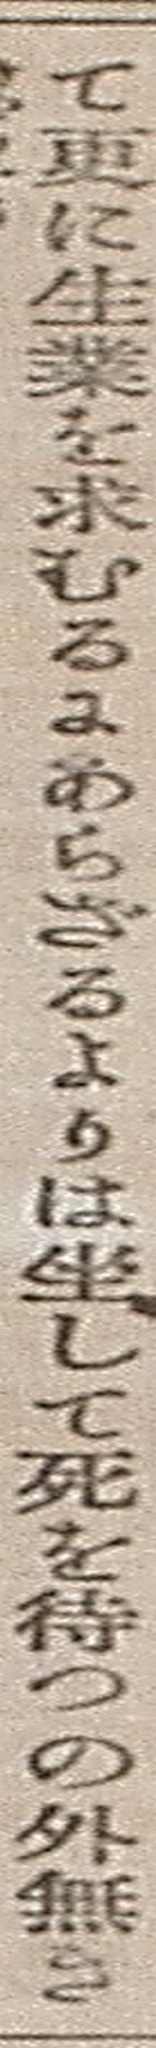て更に生業を求むるにあらざるよりは坐して死を待つの外無き
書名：風俗畫報臨時増刊第百二十六號　洪水被害録（中）
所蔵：東京大学地震研究所図書室 Earthquake Research Institute Library, The University of Tokyo, JAPAN
